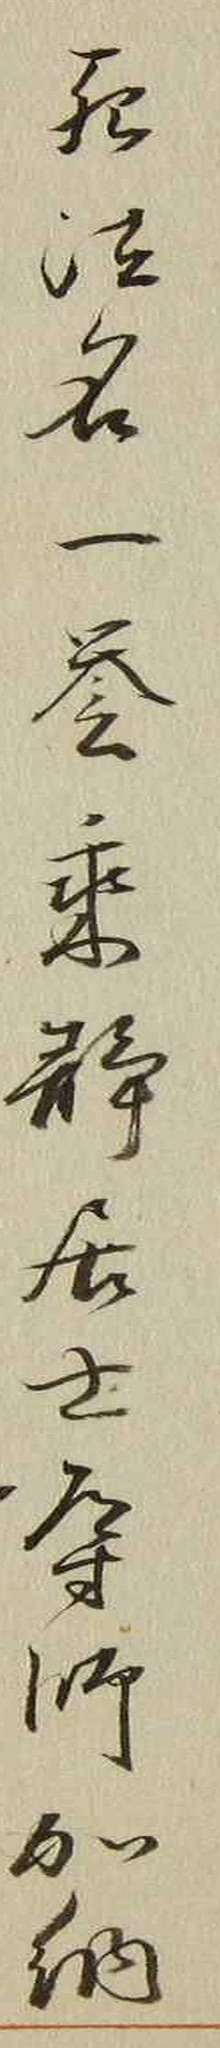死法名一誉乗静居士導師加納
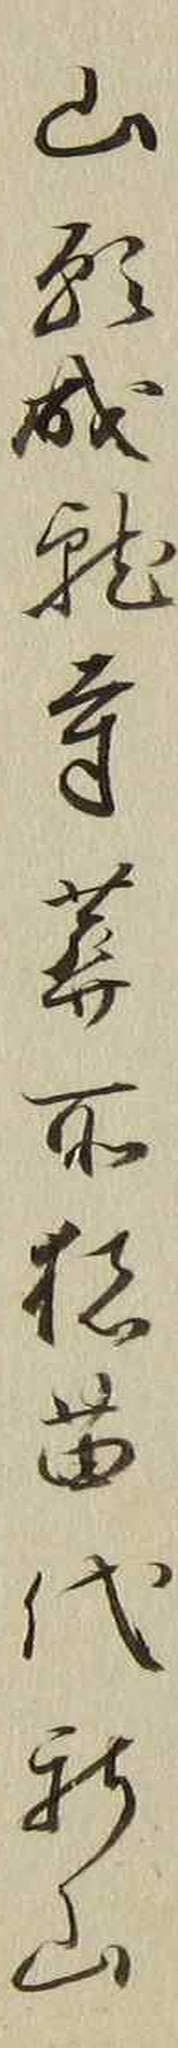山願成就寺葬所猪苗代新山
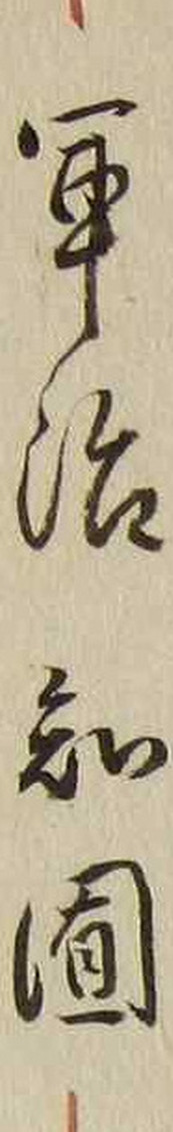軍治知囿

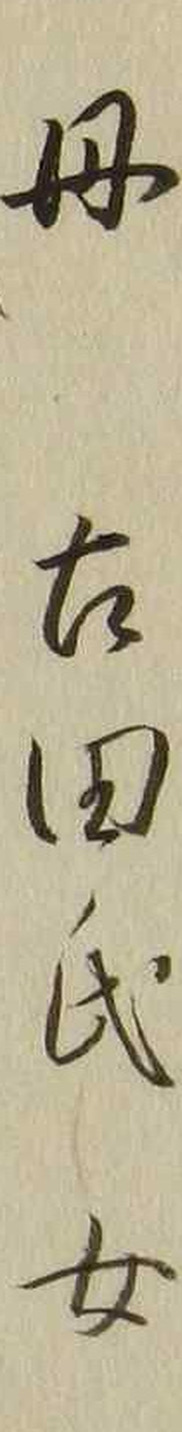母古田氏女
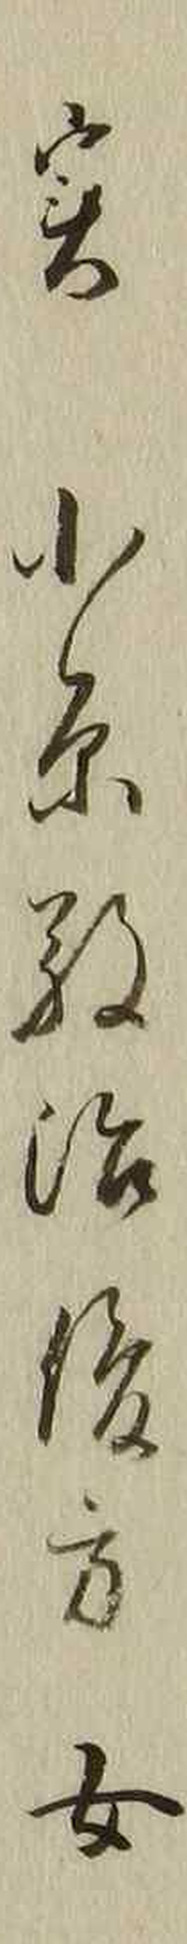実小原敬冶俊方女
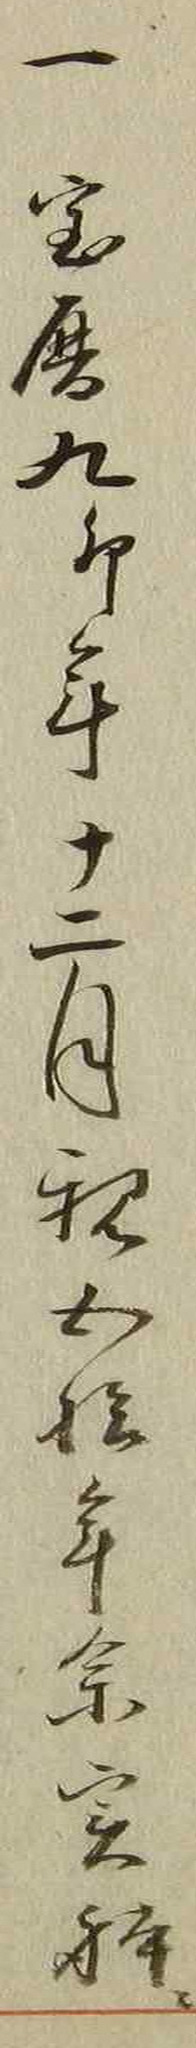一宝暦九卯年十二月親五拾年余実躰ニ
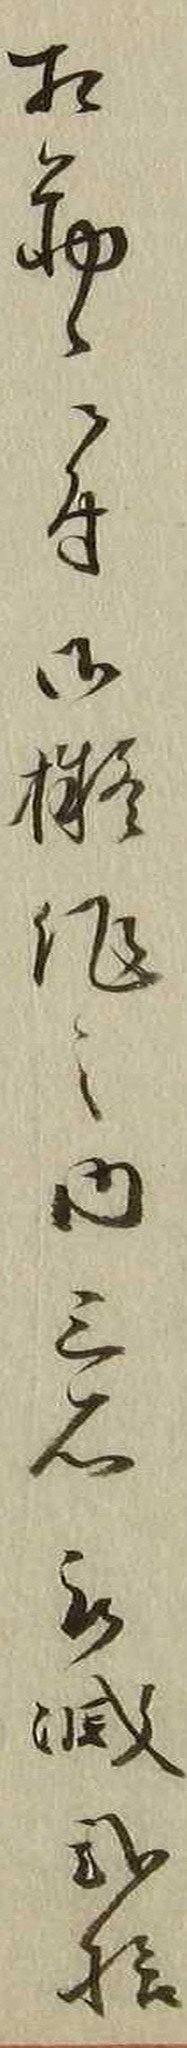相勤候ニ付御擬作之内三石被減弐拾
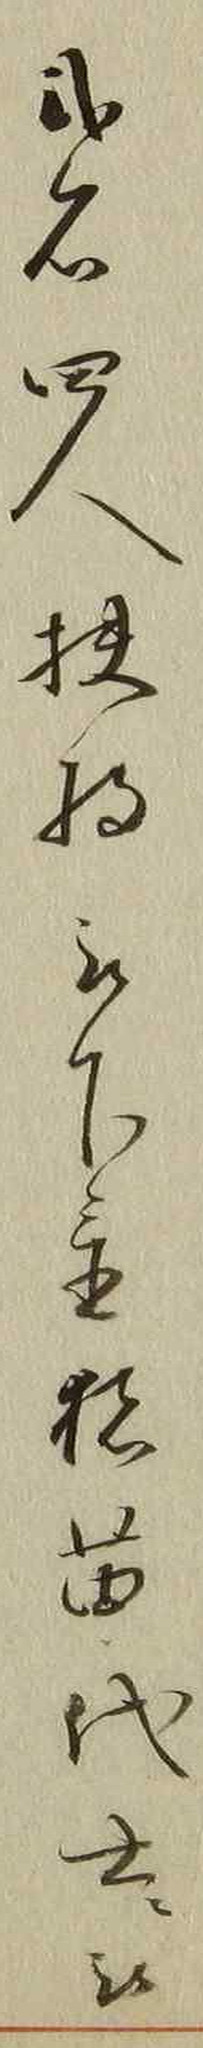弐石四人扶持被下置猪苗代士ニ被
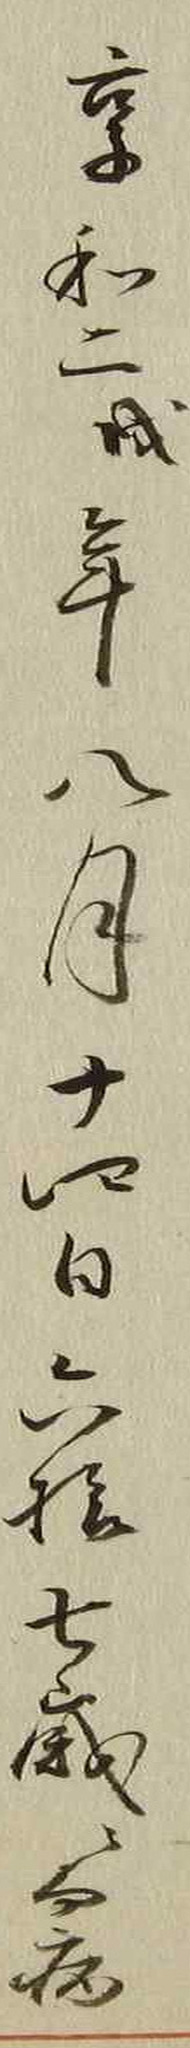享和二戌年八月十四日六拾七歳ニ而病
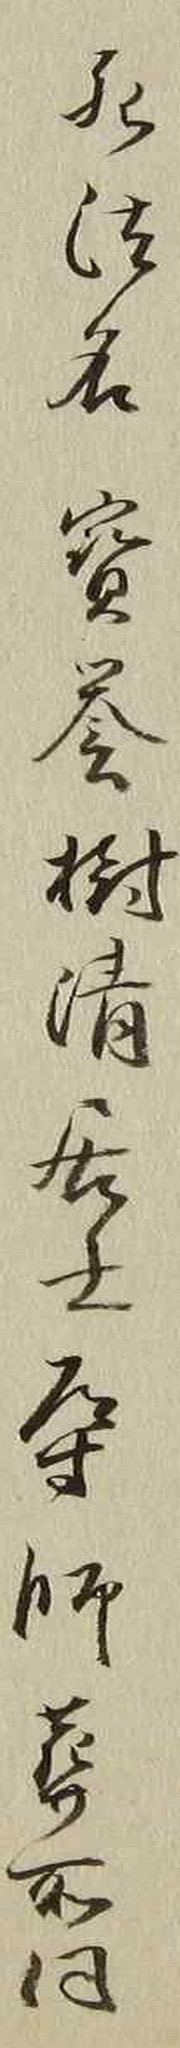死法名寶誉樹清居士導師葬所同
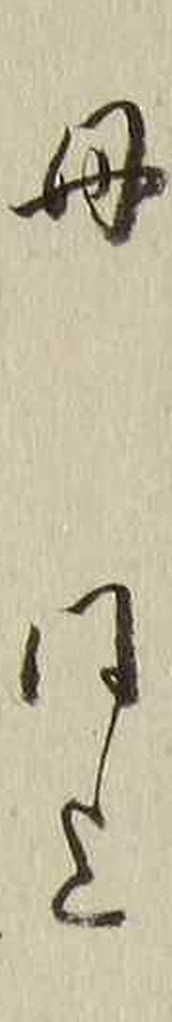母同上
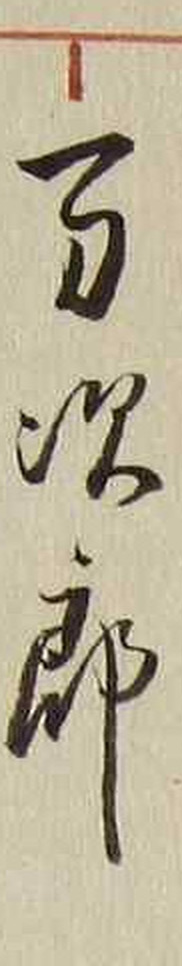万次郎

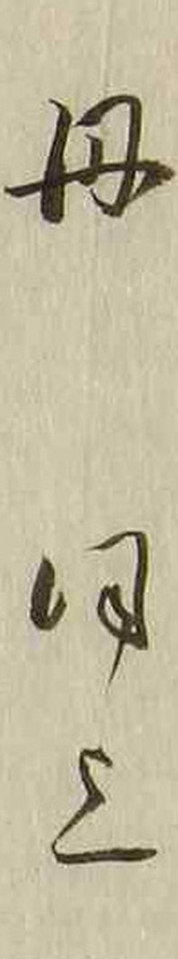母同上
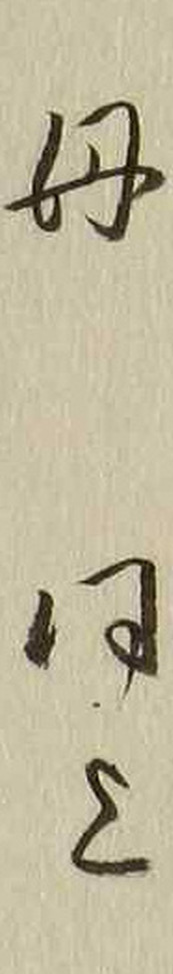母同上
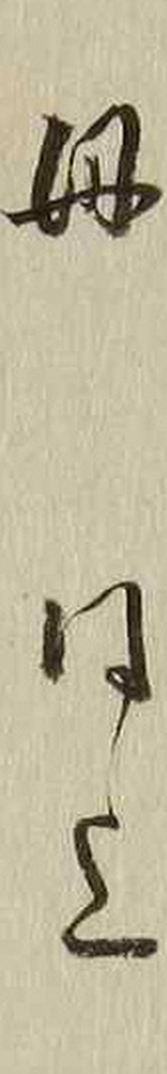母同上
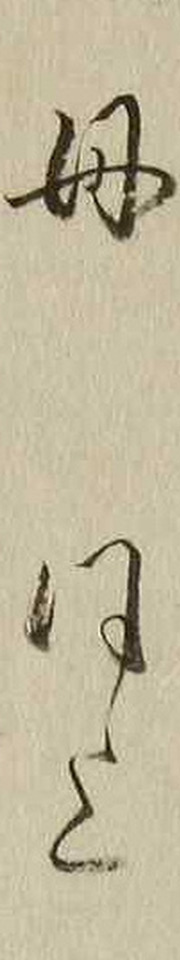母同上
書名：諸士系譜　巻之32　い之部32
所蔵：会津若松市立会津図書館
